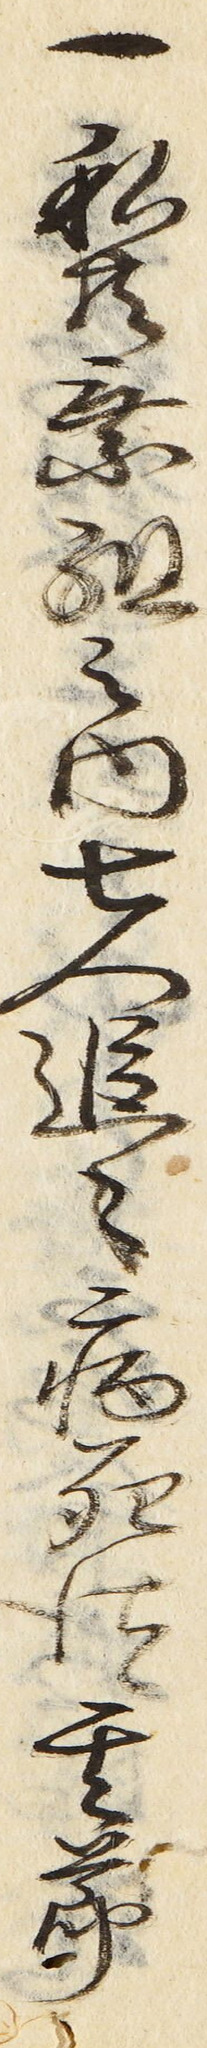一私共乗組之内七人追々病死仕候其節
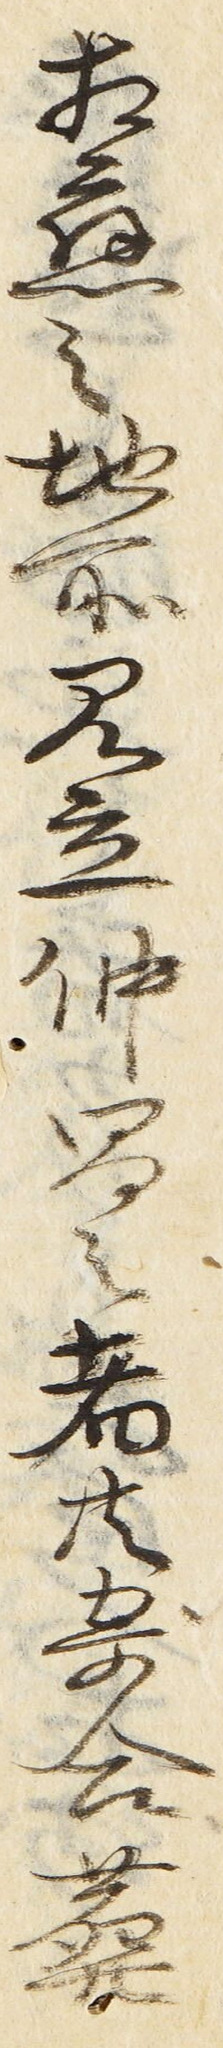相応之地所見立仲間之者共寄合葬
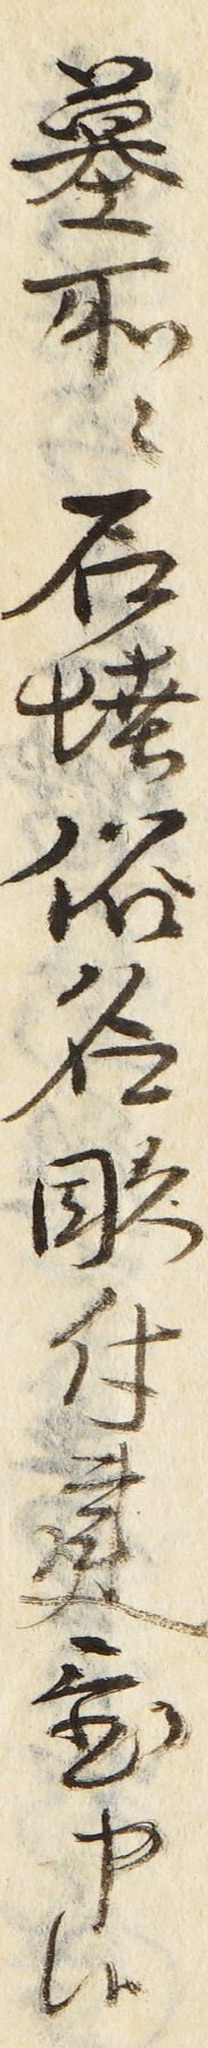墓所ニ石塔俗名彫付建置申候
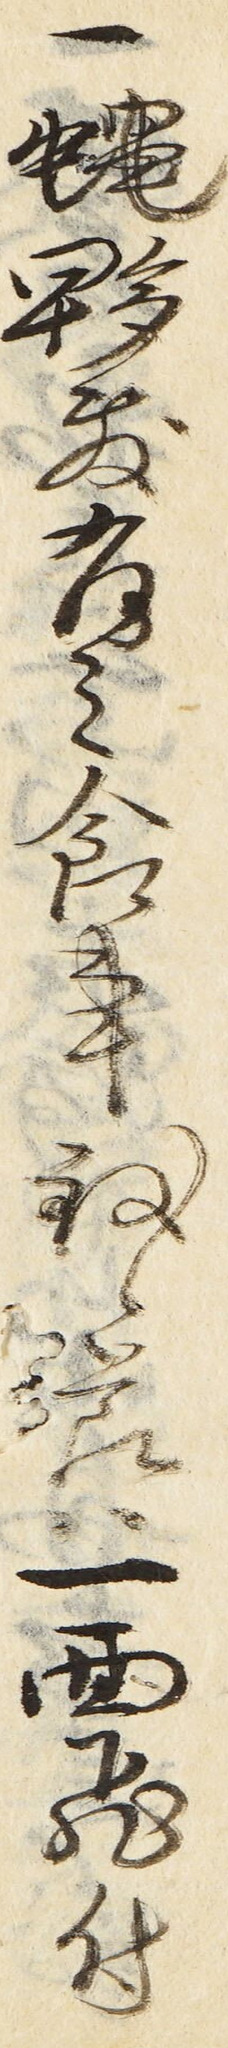一蝿夥敷有之食事致候節ハ一面飛付
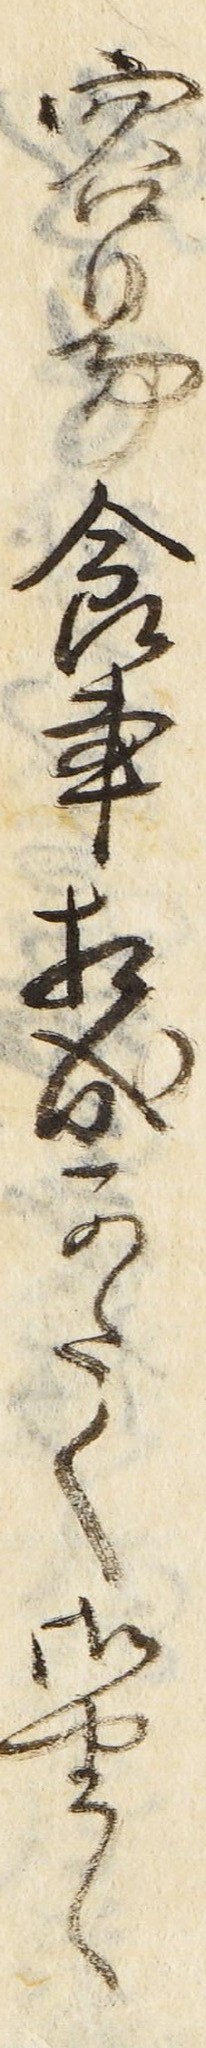容易食事相成かたく御座候
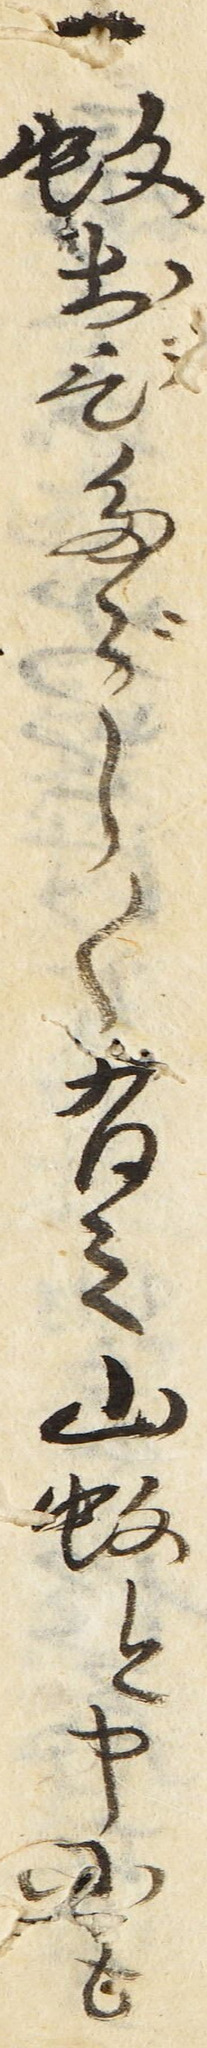一蚊おびただしく有之山蚊と申にも
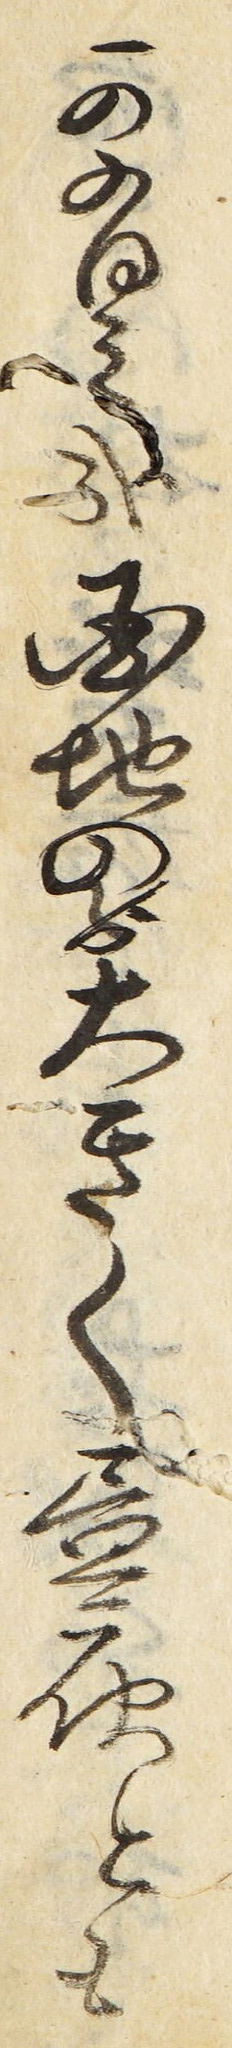可有之哉国地のゟ大きく昼夜とも

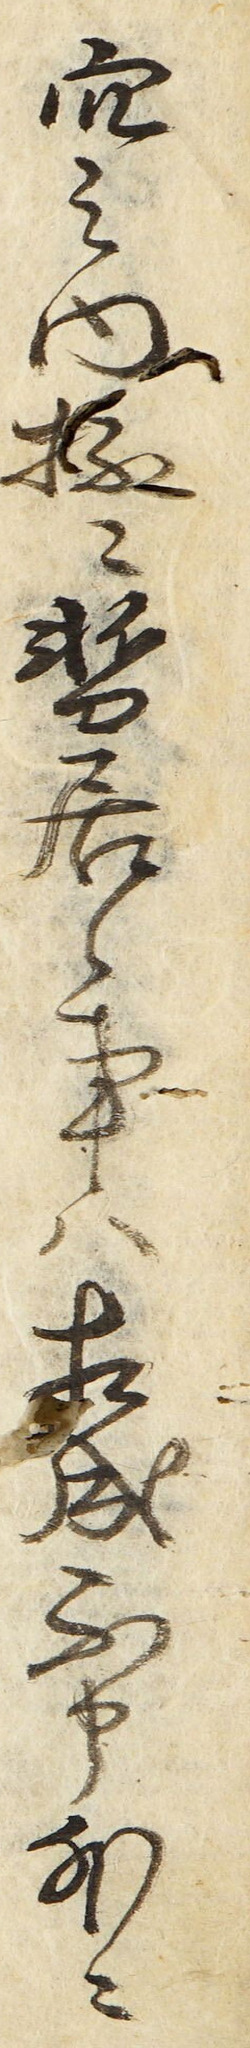穴之内極々暫居候事ハ相成不申外ニ
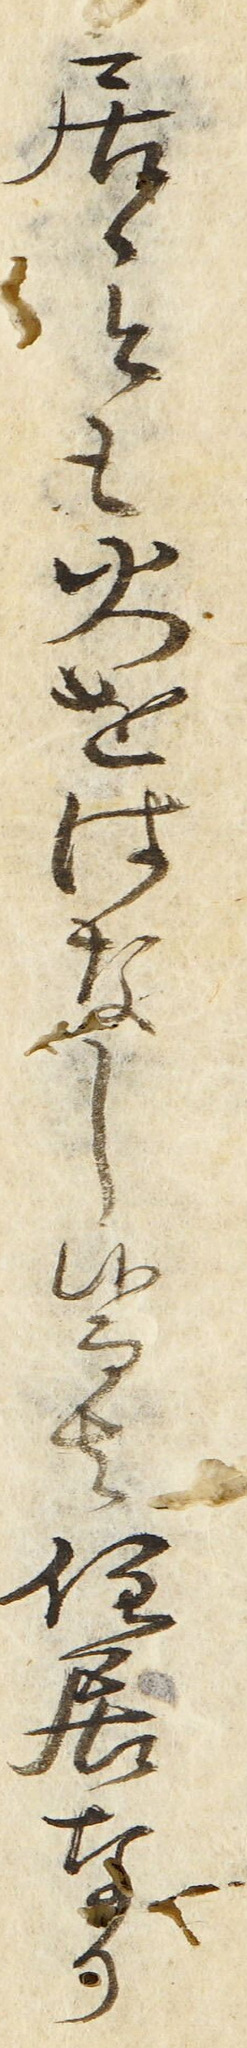居候とも火をはなし候而者住居なり
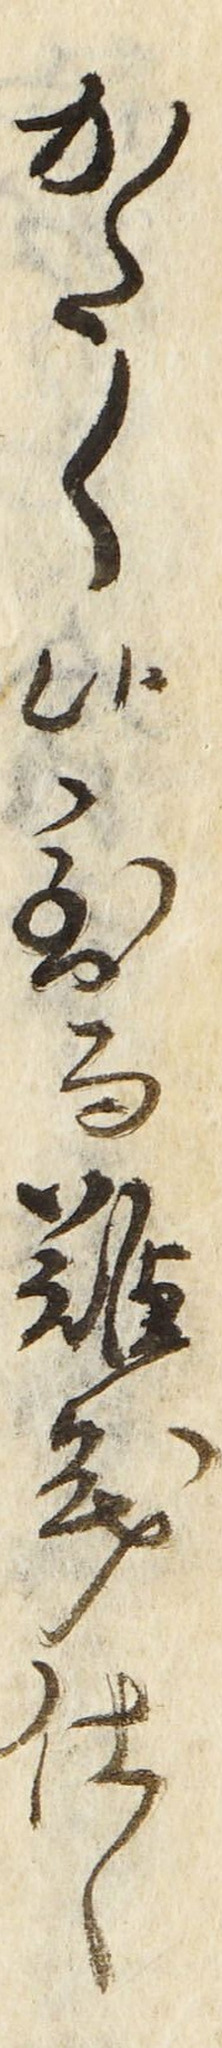かたく候至而難義仕候
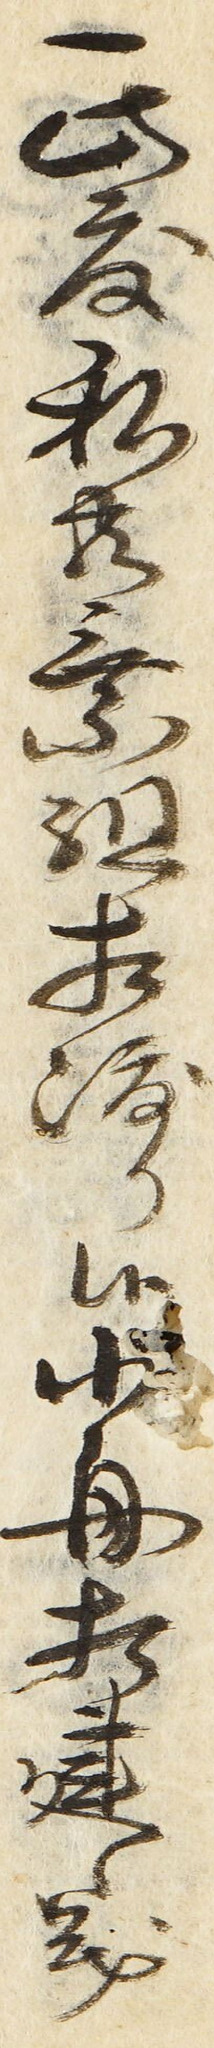一此度私共乗組相渡り候小舟相建候義
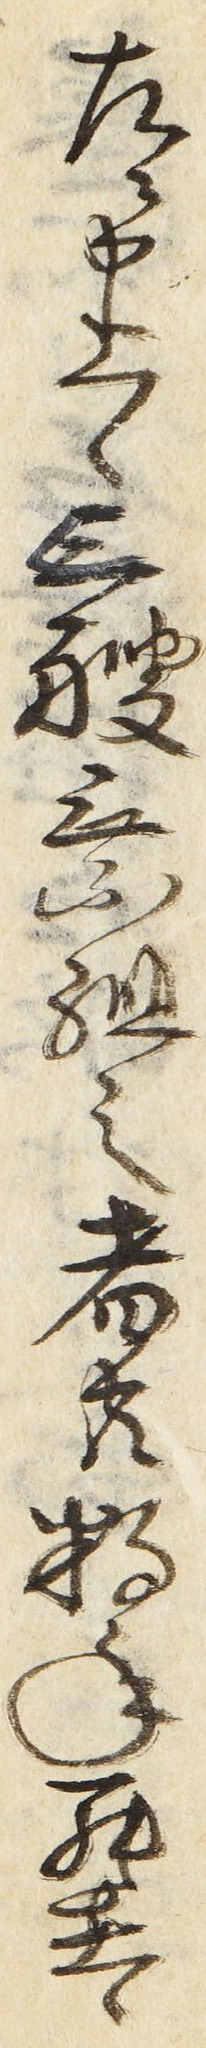左ニ申上候三艘乗組之者共数年罷在候
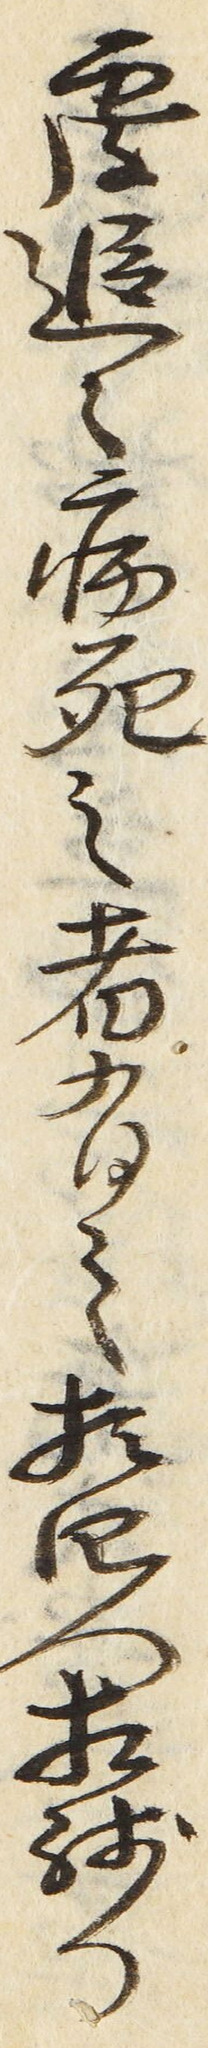処追々病死之者有之拾四人相残り
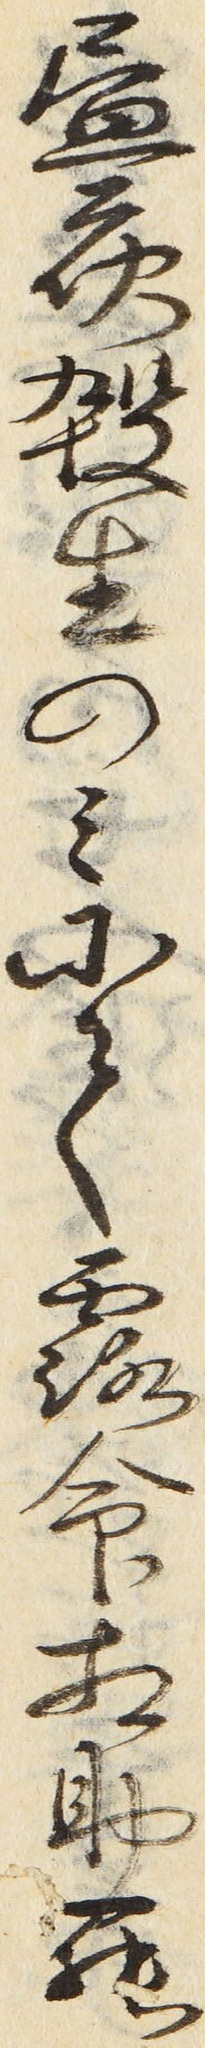昼夜殺生のミにて露命相助罷
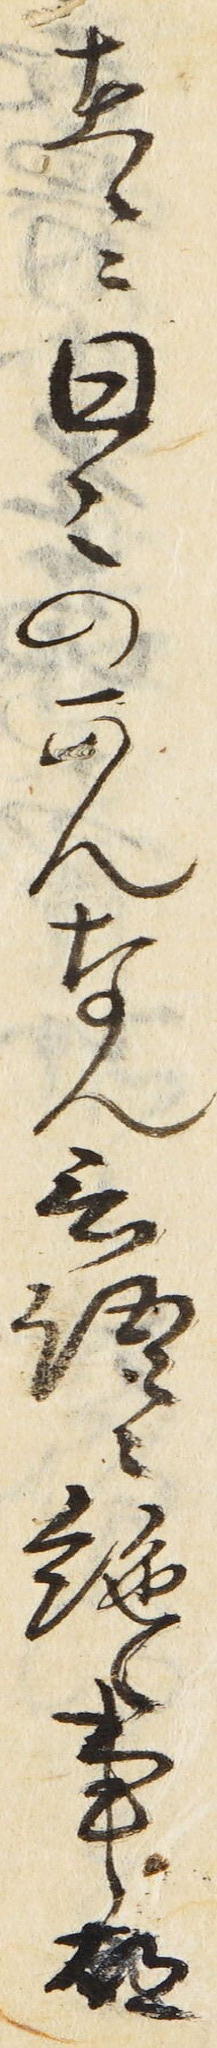在候ニ日々のかんなん言語ニ絶候事故
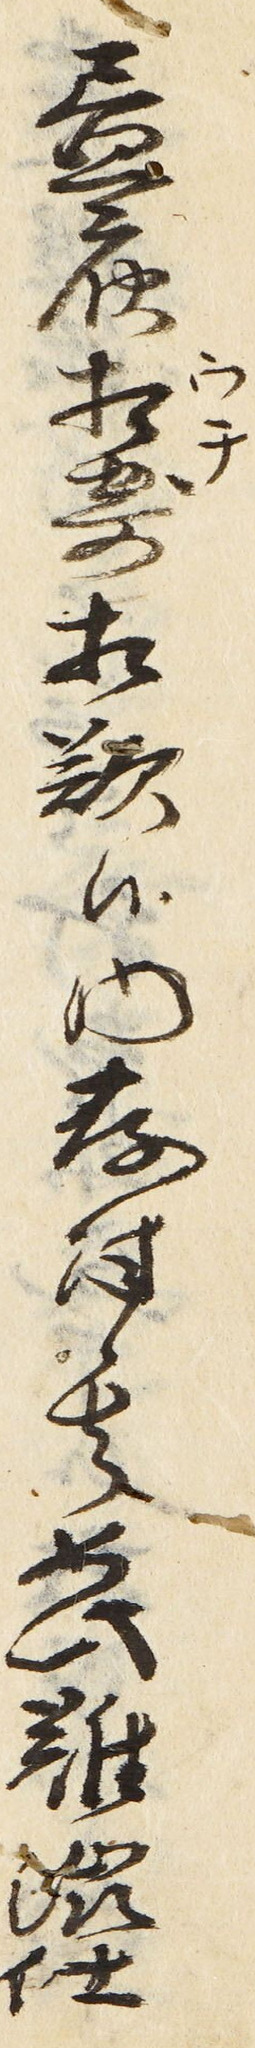昼夜打寄相歎候内存付候者如此難渋仕
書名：漂流一件上書
